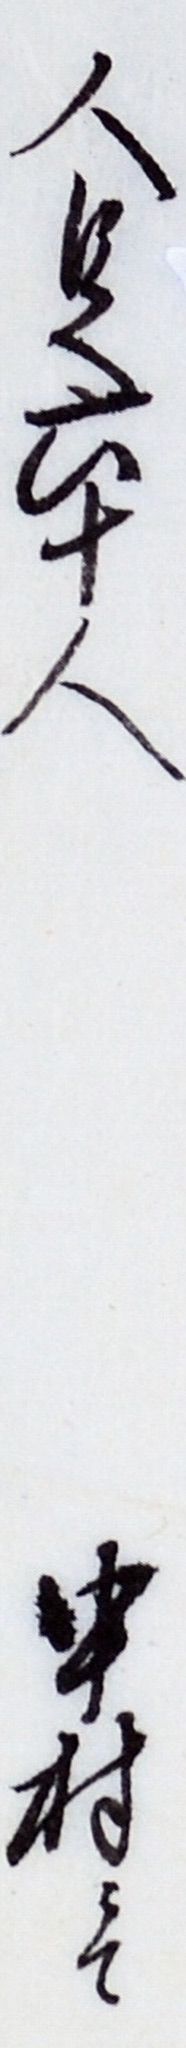一人足六十人中村ニて
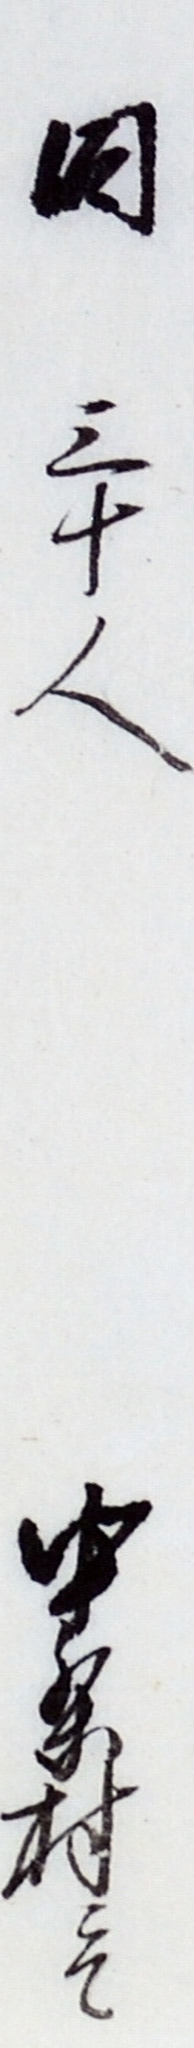同三十人中条村ニて
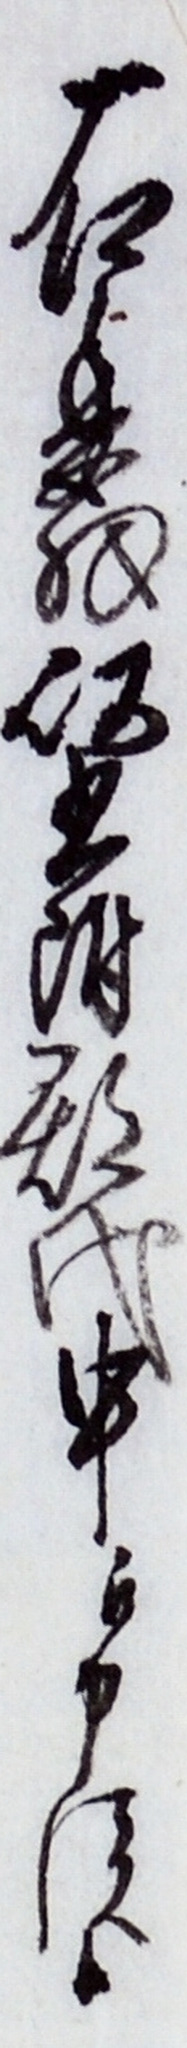右委細以書附郡代中江申談候
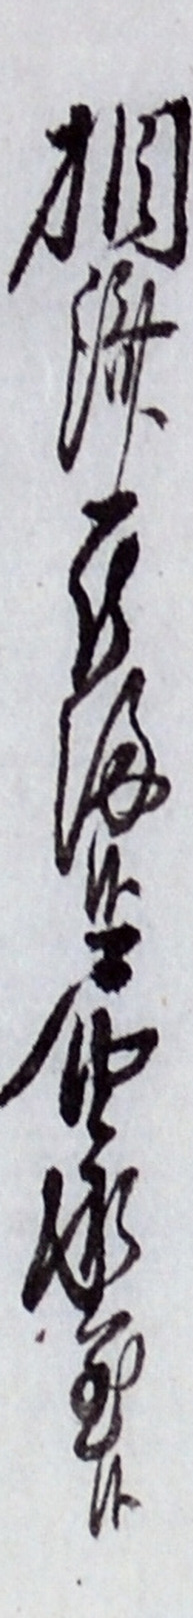相済罷帰候届承置候
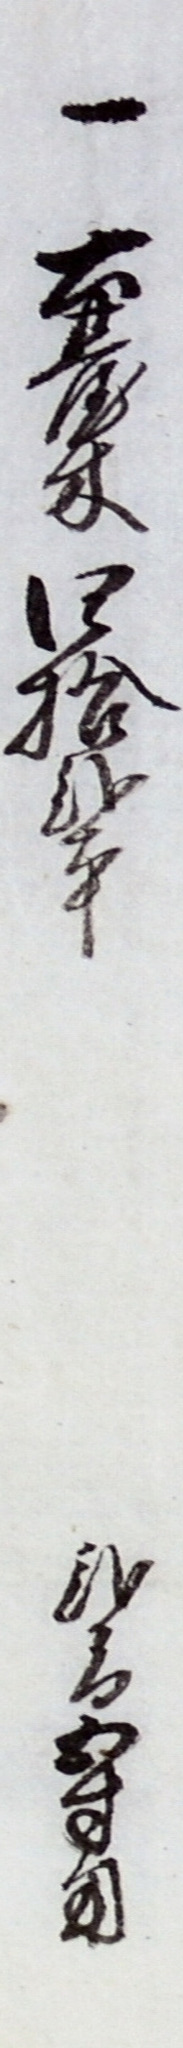一土台木四拾弐本弐間五寸角
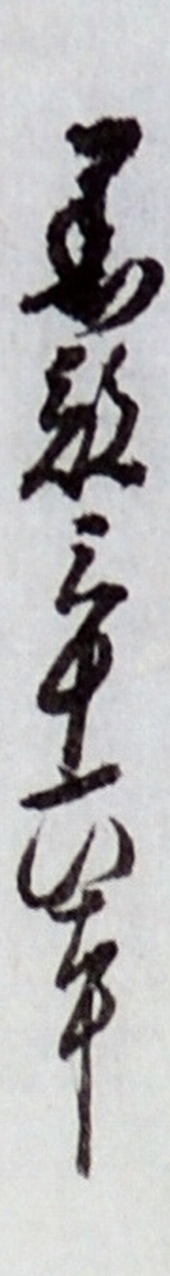黒部三十六本
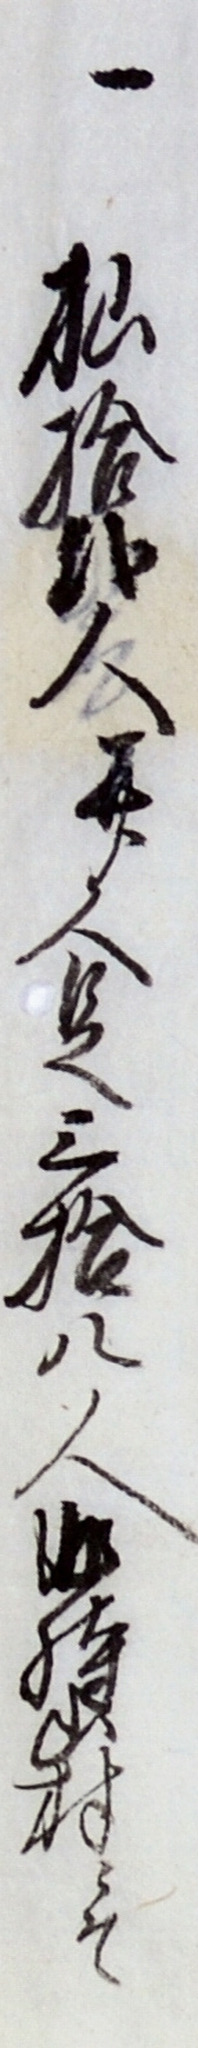一杣拾弐人并人足三拾八人非持山村ニて

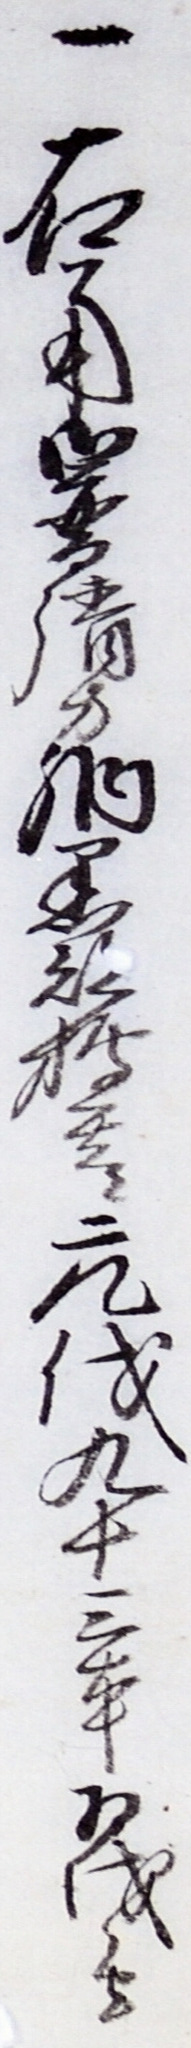一右御用御普請方納黒部榑共ニ元伐九十三本為伐候由
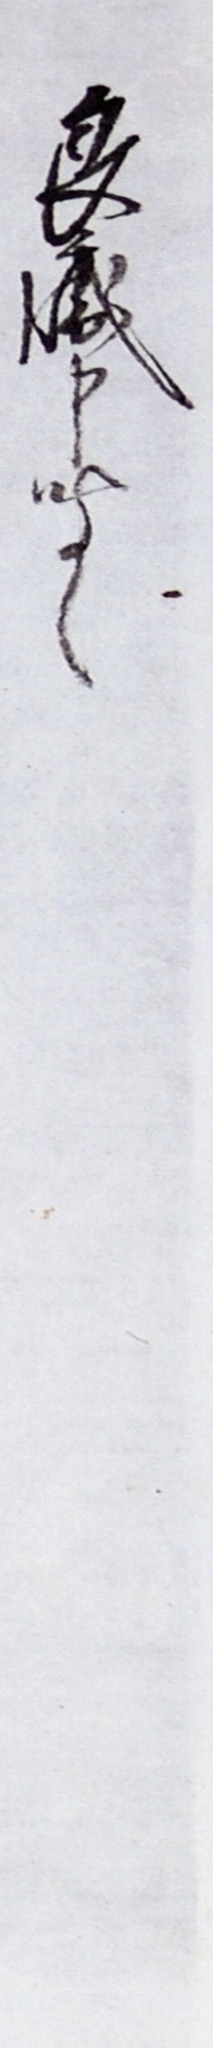良蔵申聞候
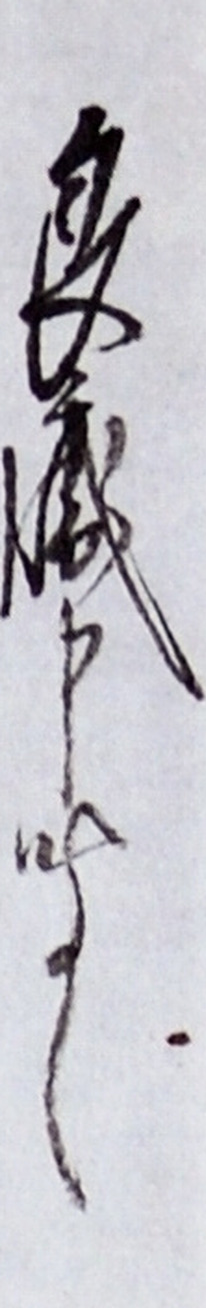良蔵申聞候
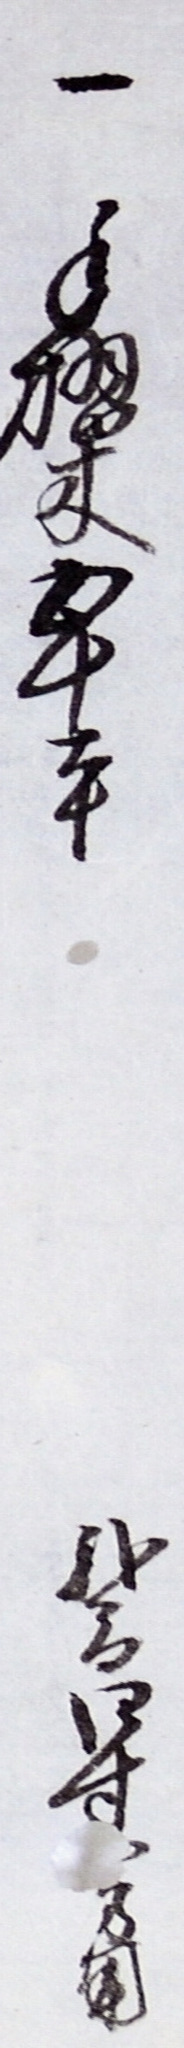一手摺木五十本弐間四寸八分角
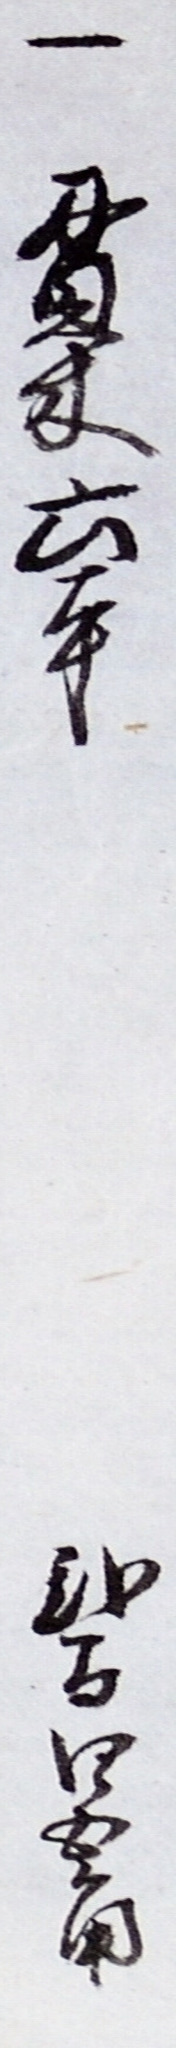一貫木六本弐間四五角
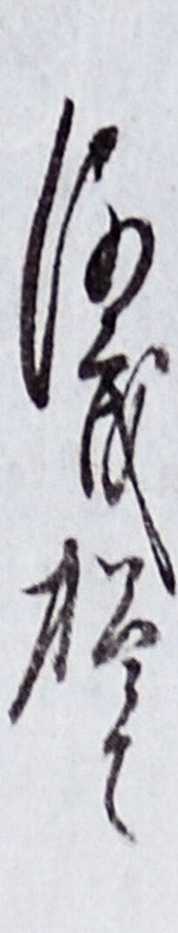何も松ニて
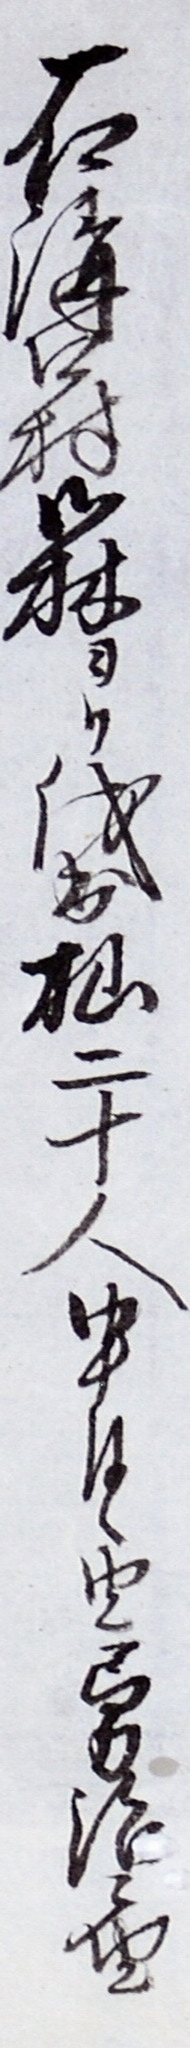右溝口村御林ヨリ伐出杣二十人申付候由勇治届
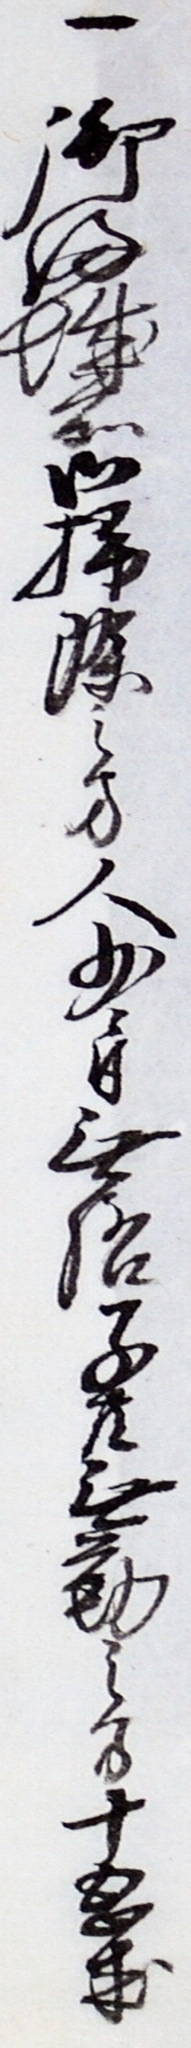一御帰城前御掃除之方人少ニ付無格子共無勤之方十五歳
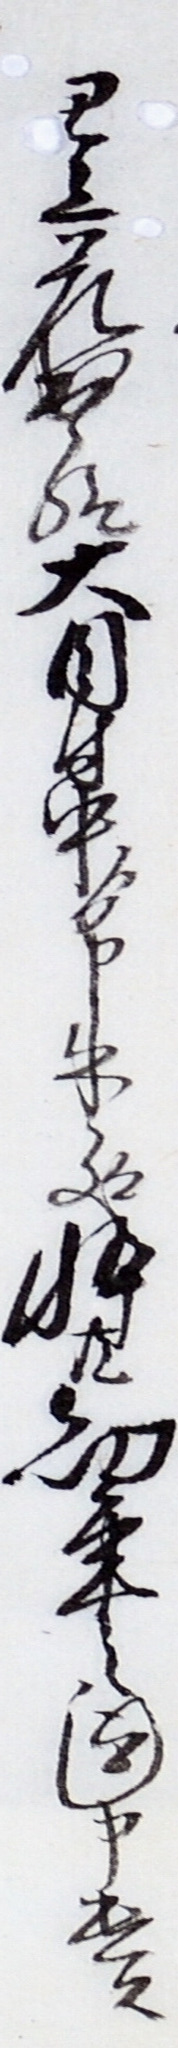已上差出候様大目付中ゟ申来候処忰共幼年之趣申遣ス
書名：御山奉行御用控
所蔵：伊那市立高遠町図書館・合同会社AMANE
